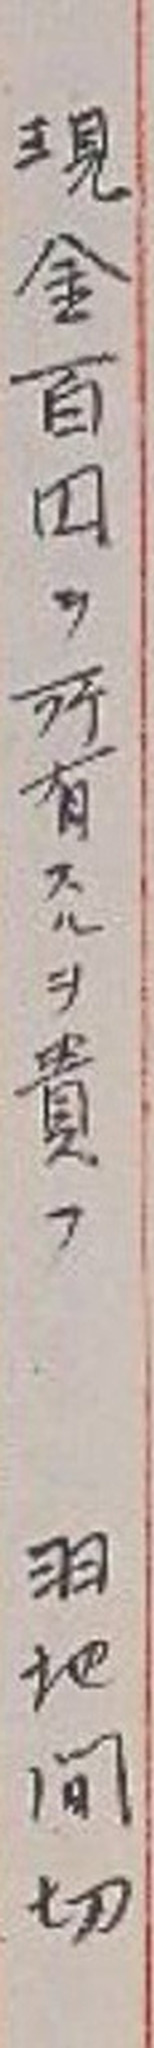現金百円ヲ所有スルヲ貴フ羽地間切

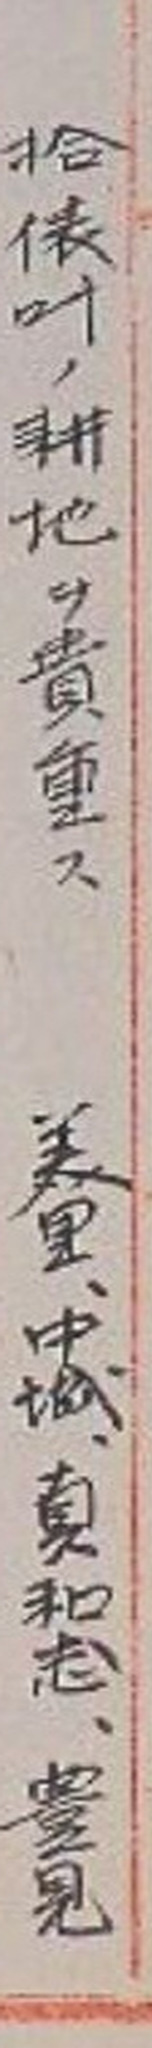拾俵叶ノ耕地ヲ貴重ス美里、中城、真和志、豊見
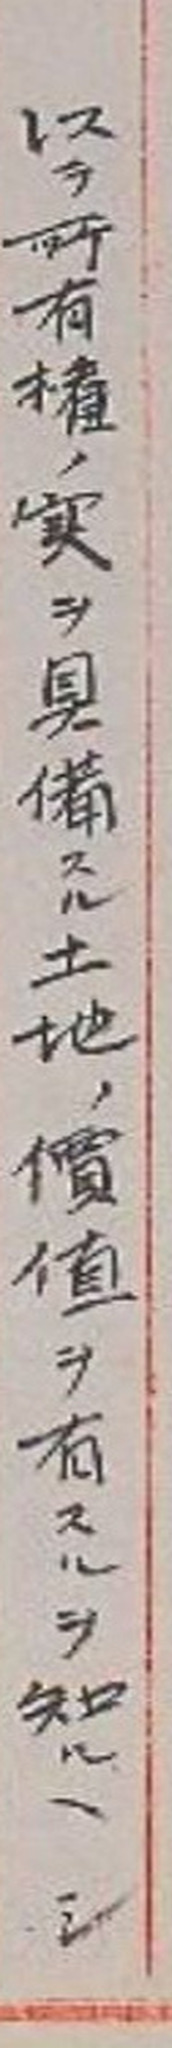以テ所有権ノ実ヲ具備スル土地ノ価値ヲ有スルヲ知ルヘシ
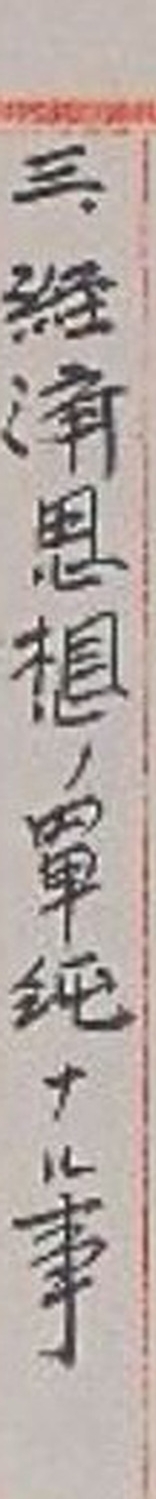三、経済思想ノ単純ナル事
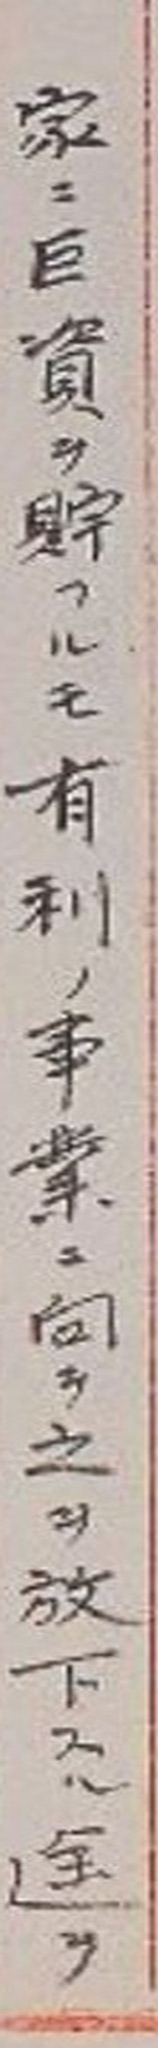家ニ巨資ヲ貯フルモ有利ノ事業ニ向テ之ヲ放下スル途ヲ
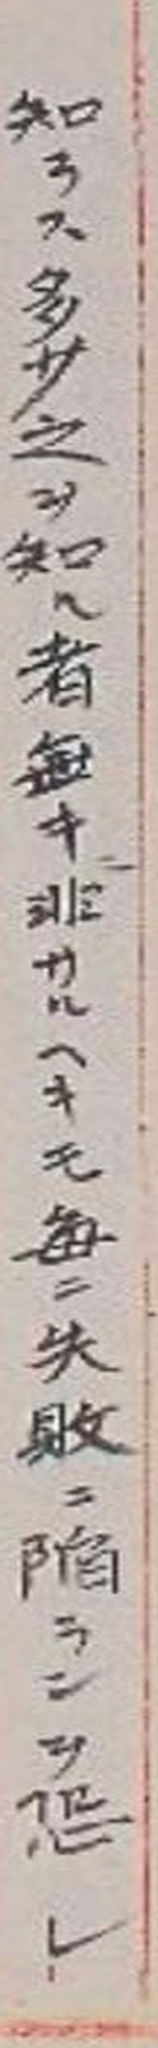知ラス多少之ヲ知ル者無キニ非サルヘキモ毎ニ失敗ニ陥ランヲ恐レ
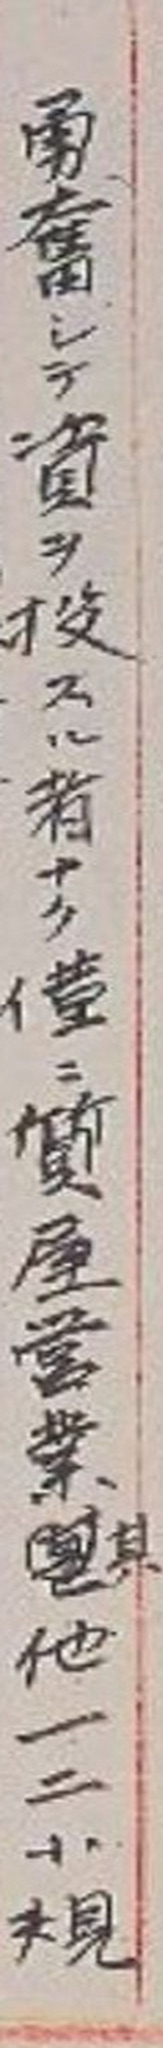勇奮シテ資ヲ投スル者ナク僅ニ質屋営業其他一二小規
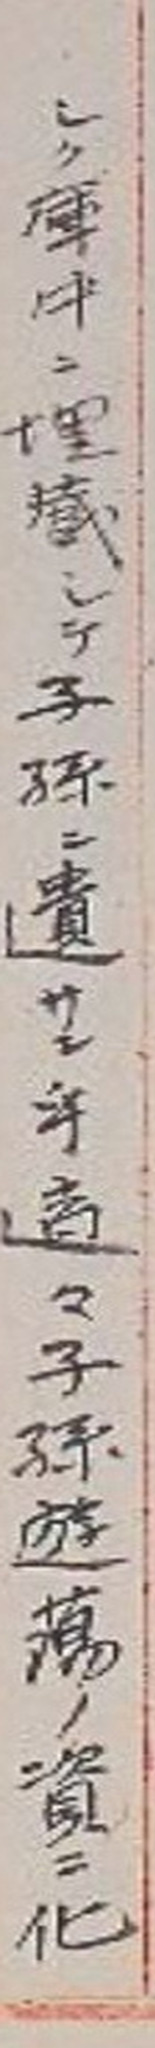シク庫中ニ埋蔵シテ子孫ニ遺サン乎適々子孫遊蕩ノ資ニ化
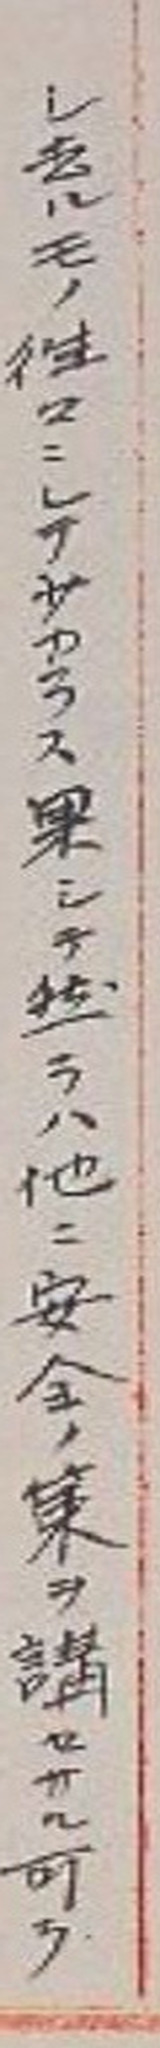シ去ルモノ往々ニシテ少カラス果シテ然ラハ他ニ安全ノ策ヲ講セサル可ラ
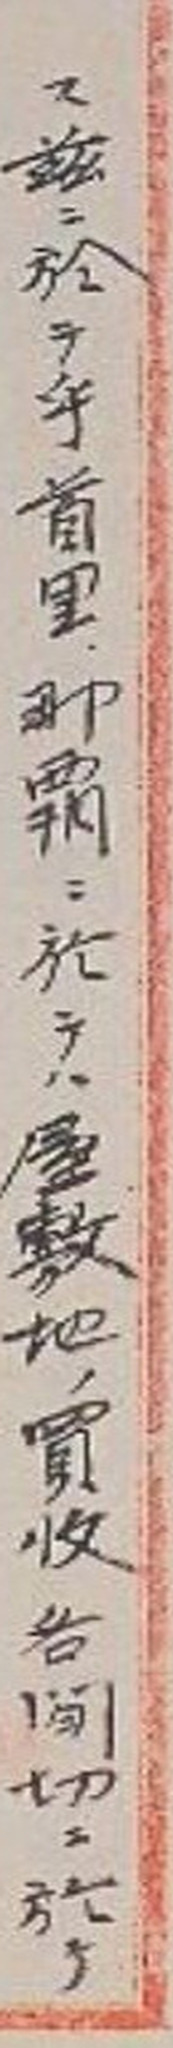ス茲ニ於テ乎首里、那覇ニ於テハ屋敷地ノ買収各間切ニ於テ
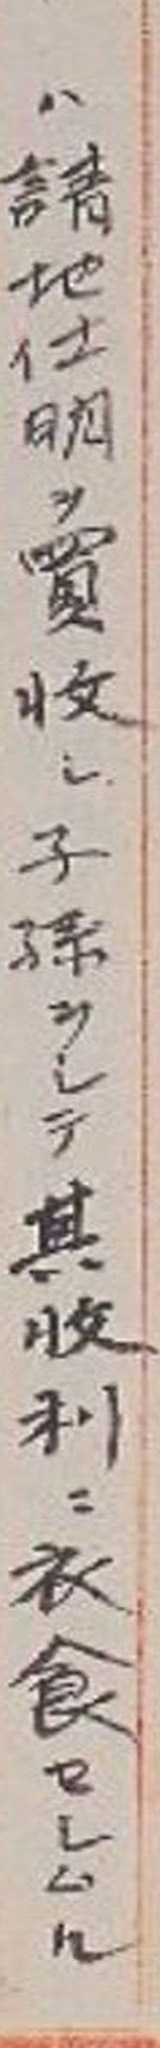ハ請地仕明ヲ買収シ子孫ヲシテ其収利ニ衣食セシムル
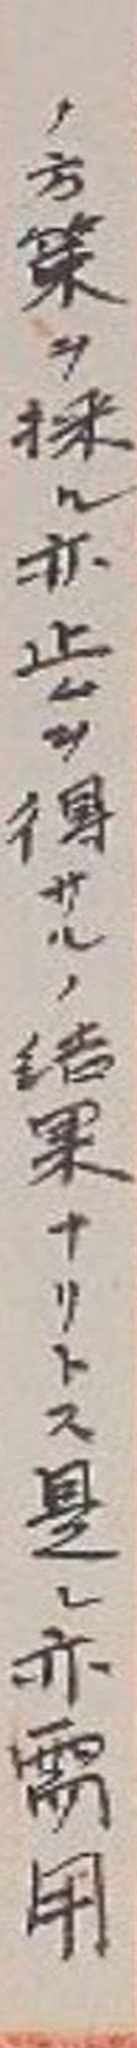ノ方策ヲ採ル亦止ムヲ得サルノ結果ナリトス是レ亦需用
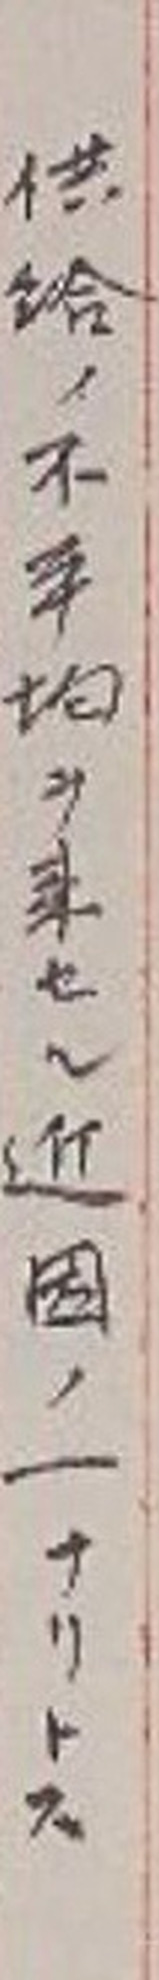供給ノ不平均ヲ来セル近因ノ一ナリトス
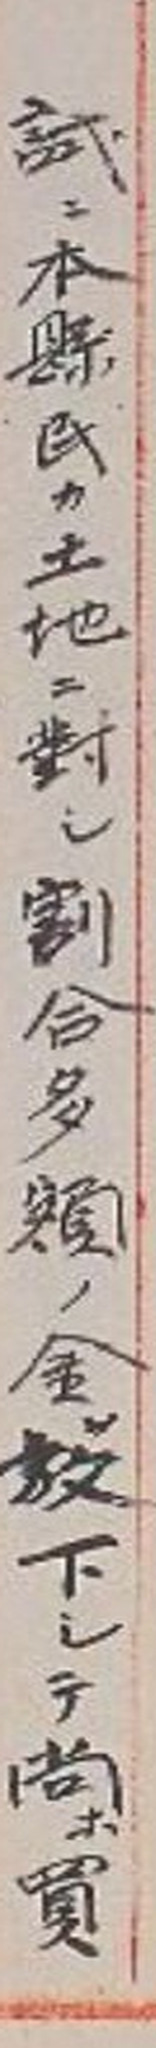試ニ本県民カ土地ニ対シ割合多額ノ金ヲ放下シテ尚ホ買
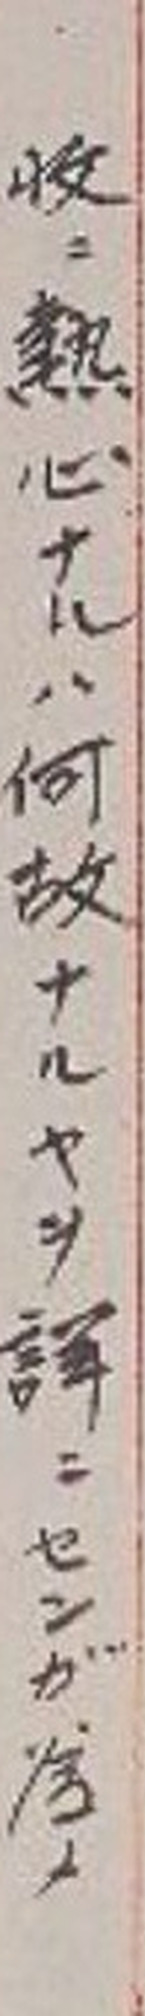収ニ熱心ナルハ何故ナルヤヲ詳ニセンガ為メ
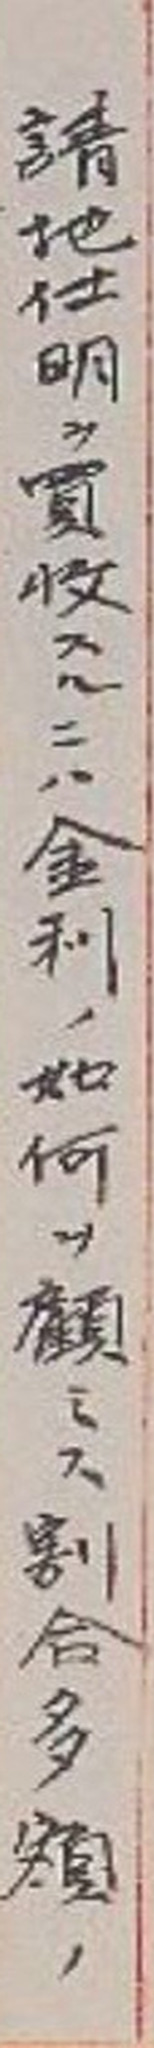請地仕明ヲ買収スルニハ金利ノ如何ヲ顧ミス割合多額ノ
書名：本県地価ノ高キ理由調書
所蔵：University of the Ryukyus Library
